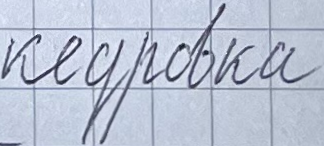кедровка
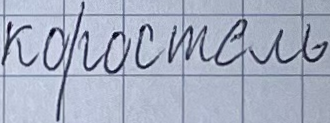коростель
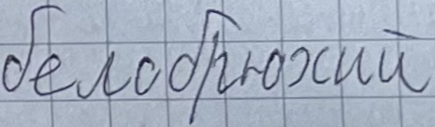белобрюхий
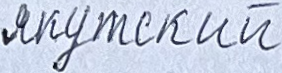якутский
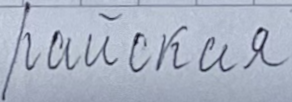райская
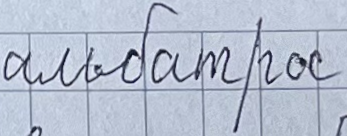альбатрос
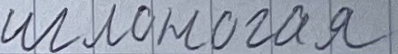иглоногая
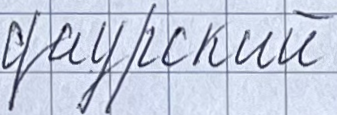даурский
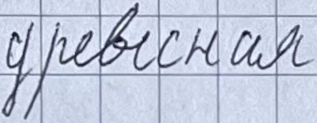древесная
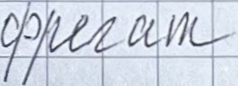фрегат
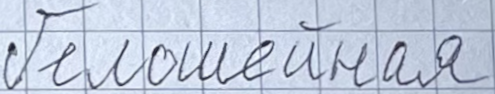белошейная
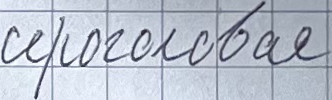сероголовая
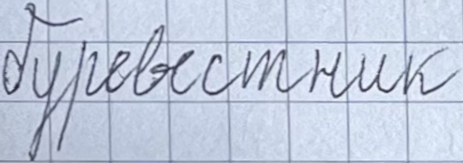буревестник
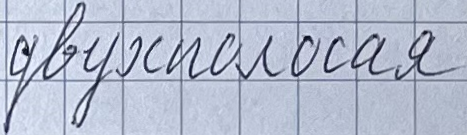двухполосая
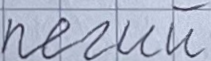пегий
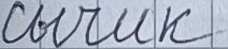сычик
